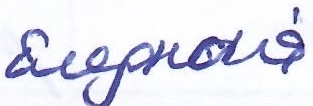бледная
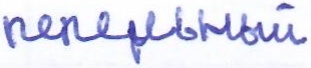пепельный
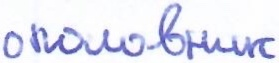ополовник
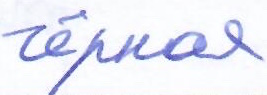чёрная
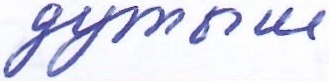дутыш
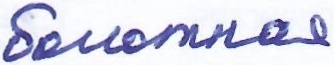боиотная
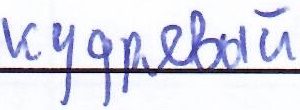кудрявый
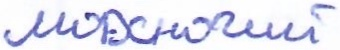махногий
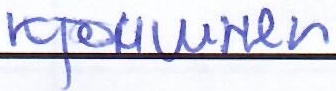кроншнеп
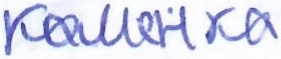каменка
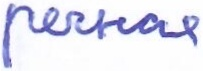речная
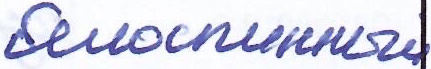белоспинный
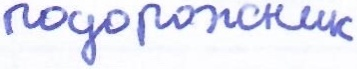подорожник
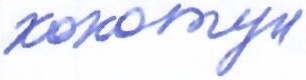хохотун
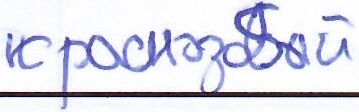краснозобый
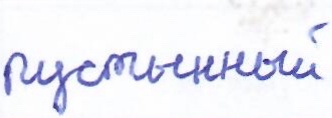пустынный
